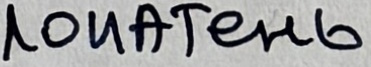лопатень
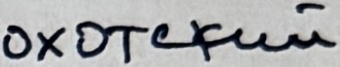охотский
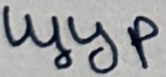щур
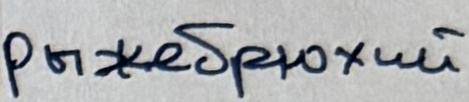рыжебрюхий
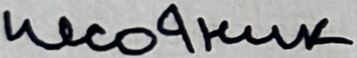песочник
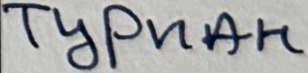турпан
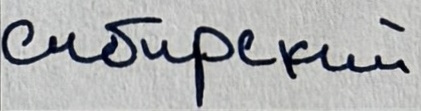сибирский
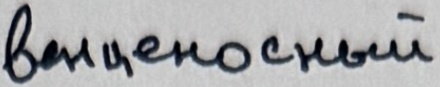венценосный
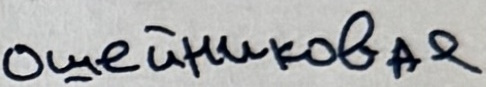ошейниковая
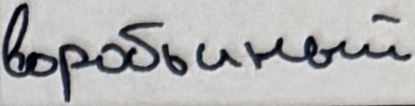воробьиный
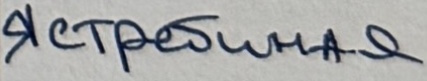ястребиная
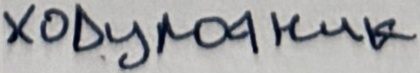ходулочник
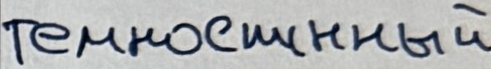темноспинный
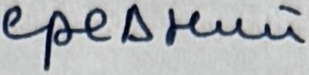средний
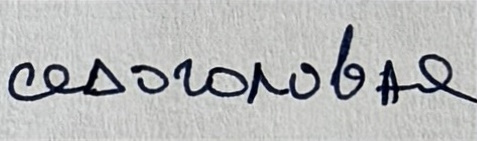седоголовая
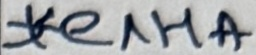желна
